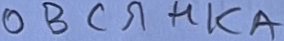овсянка
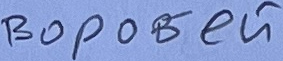воробей
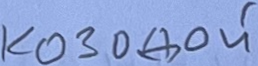козодой
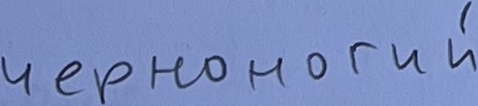черноногий
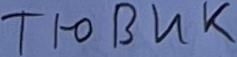тювик
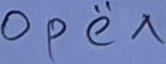орёл
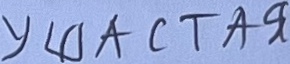ушастая
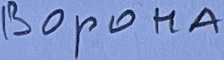ворона
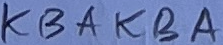кваква
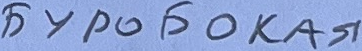буробокая
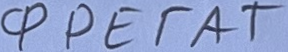фрегат
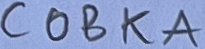совка
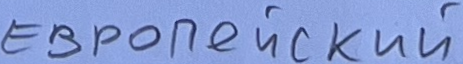европейский
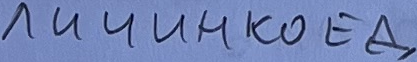личинкоед
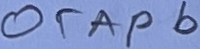огарь
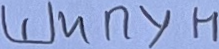шипун
